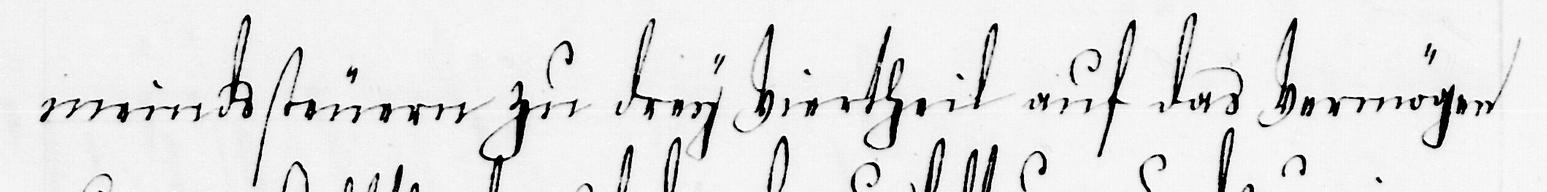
meindssteuern zu drey Viertheil auf das Vermögen
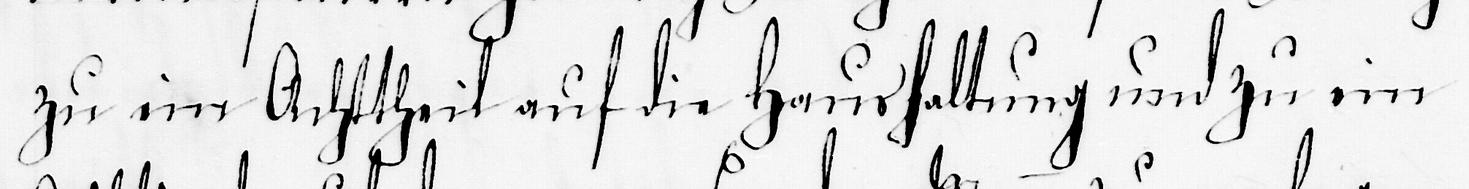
zu im Achttheil auf die Haushaltung und zu ein
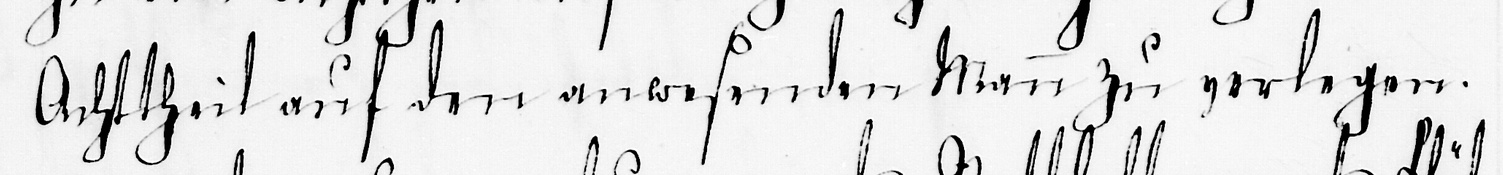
Achttheil auf den anwesenden Mann zu verlegen.
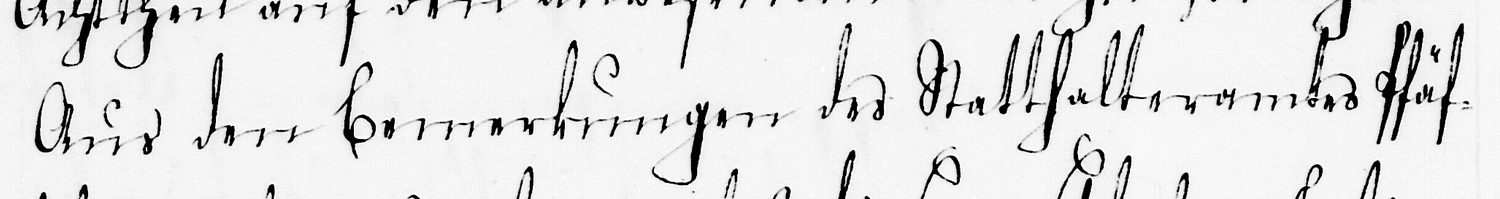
Aus den Bemerkungen des Statthalteramtes Pfäf¬
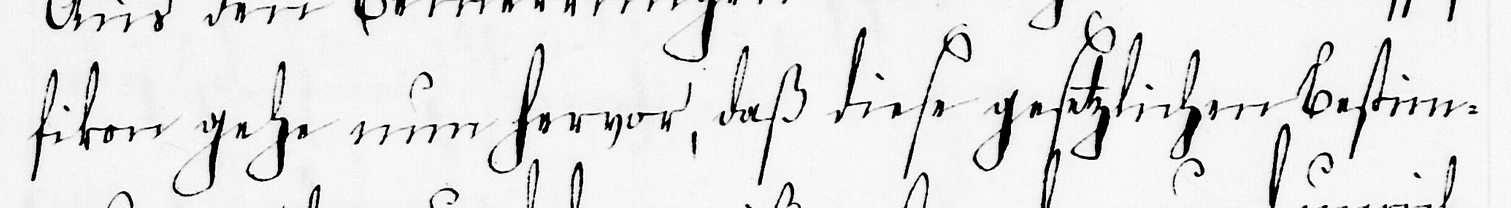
fikon gehe nun hervor, daß diese gesetzlichen Bestim¬
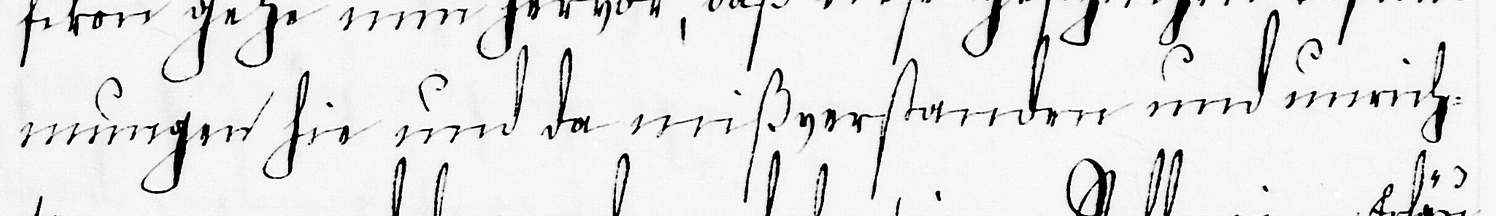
mungen hie und da mißverstanden und unrich¬
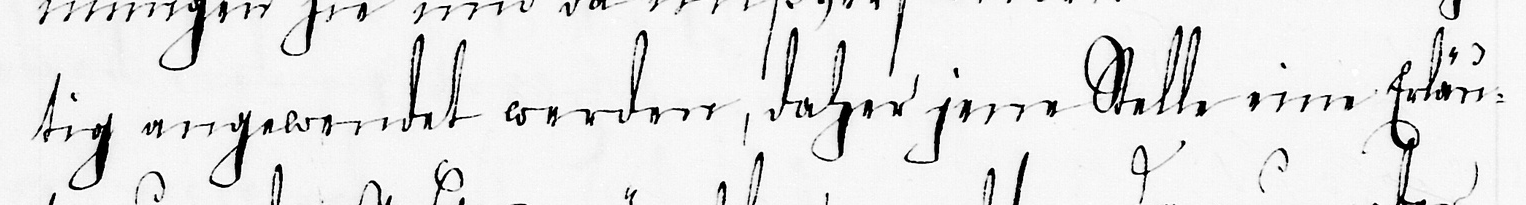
tig angewendet werden, daher jene Stelle eine Erläu¬
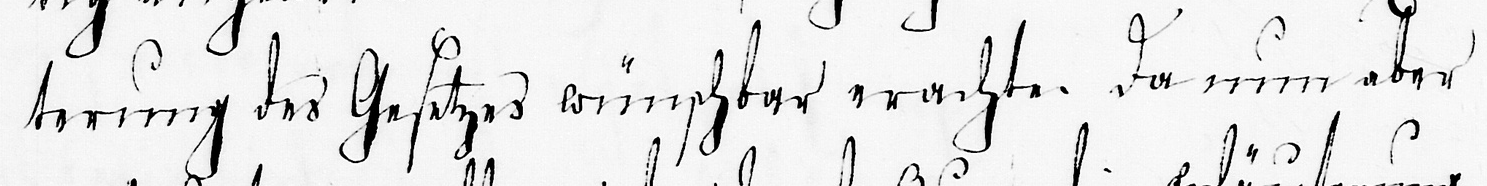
terung des Gesetzes wünschbar erachte. Da nun aber
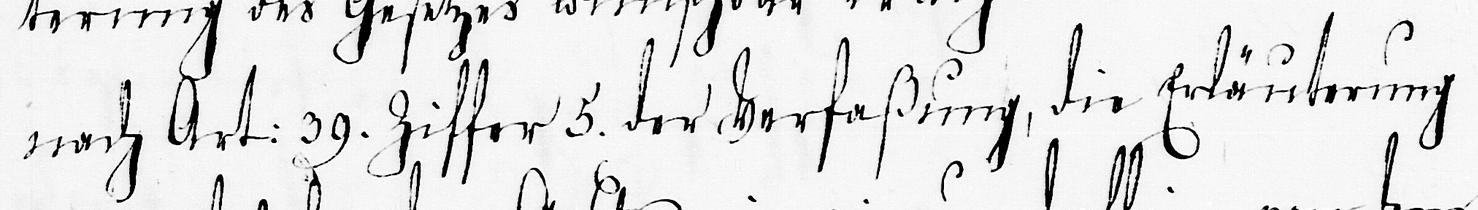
nach Art: 39. Ziffer 5. der Verfaßung, die Erläuterung
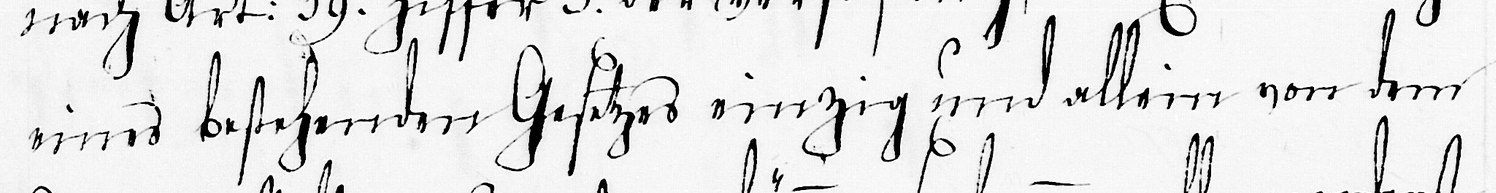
eines bestehenden Gesetzes einzig und allein von dem
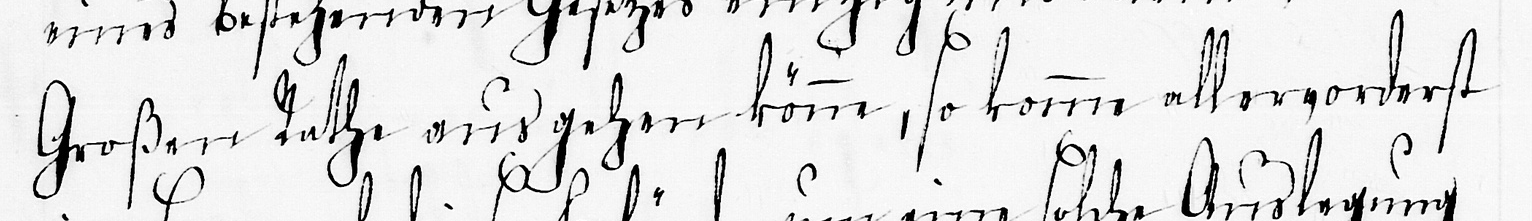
Großen Rathe ausgehen könne, so komme allervorderst
